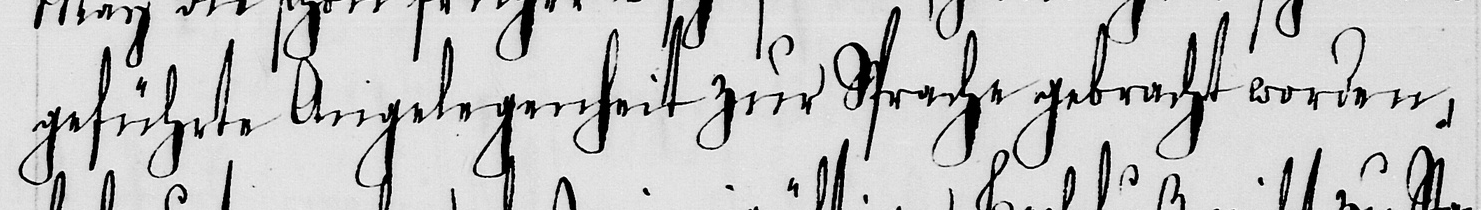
geführte Angelegenheit zur Sprache gebracht worden,
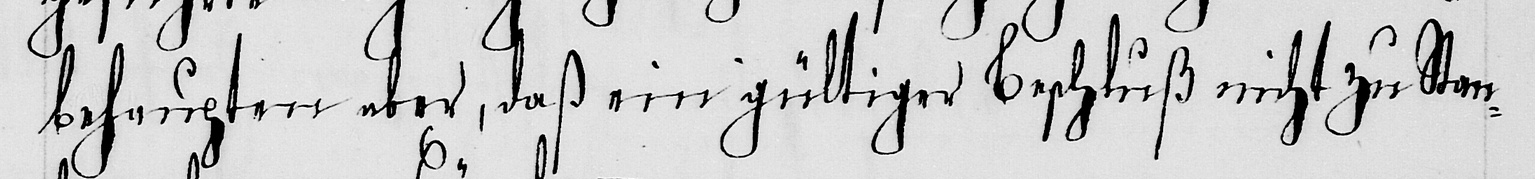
behaupten aber, daß ein gültiger Beschluß nicht zu Stan¬
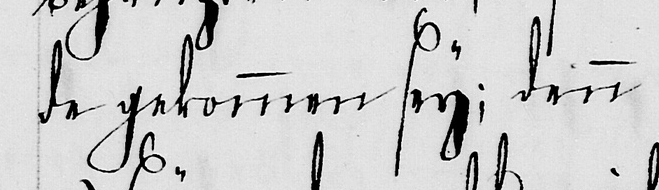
de gekommen sey; denn
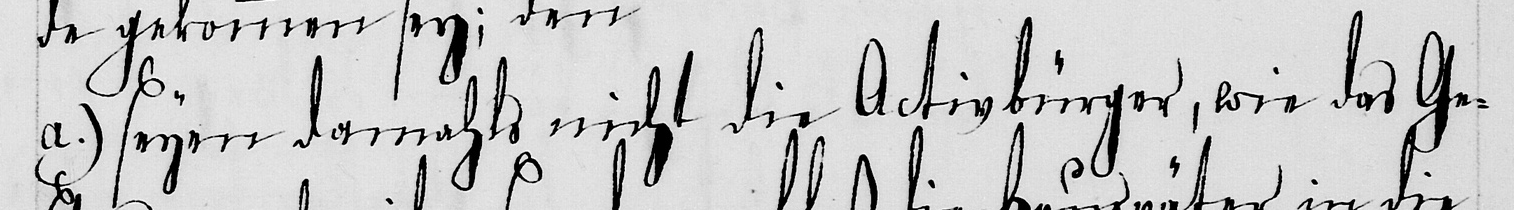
a.) seyen damahls nicht die Activbürger, wie das Ge¬
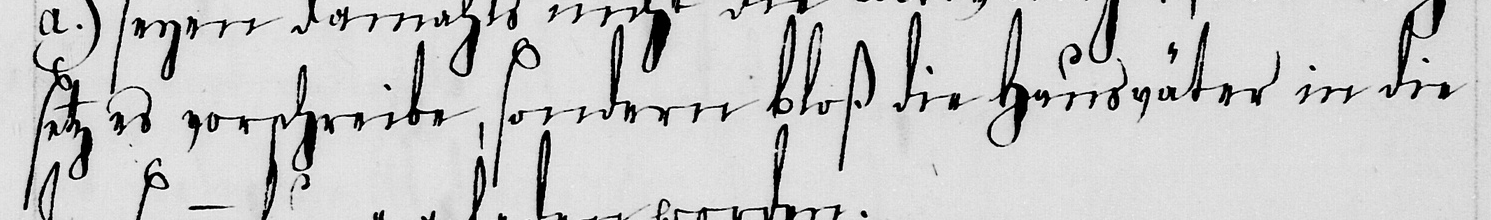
setz es vorschreibe, sondern bloß die Hausväter in die
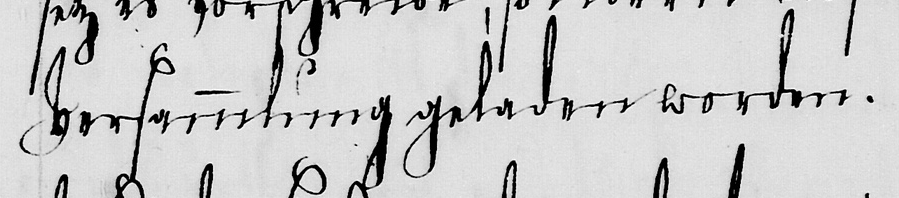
Versammlung geladen worden.
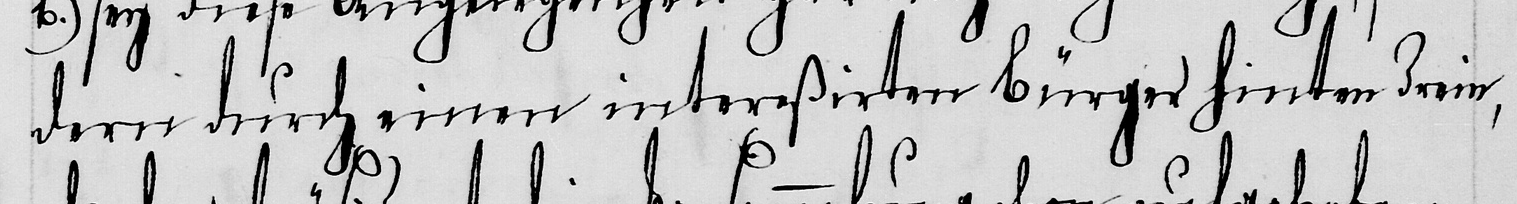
dern durch einen intereßirten Bürger hinten drein,
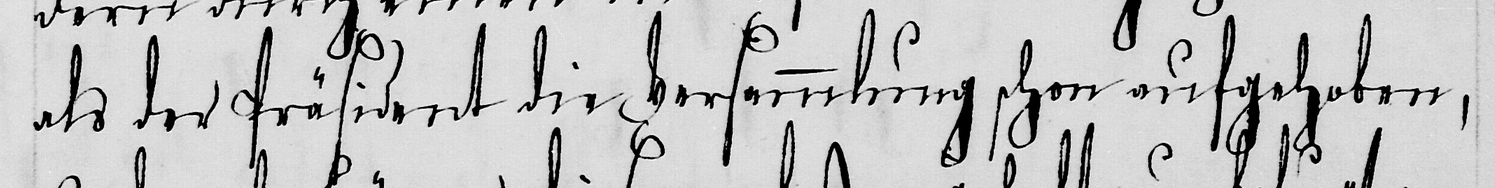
als der Präsident die Versammlung schon aufgehoben,
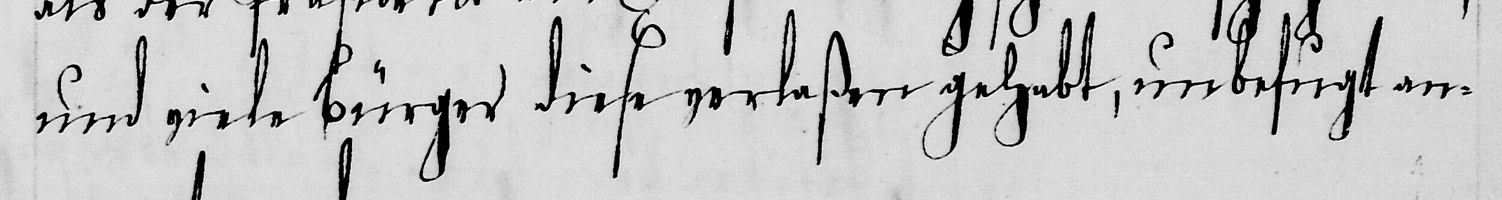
und viele Bürger diese verlaßen gehabt, unbefugt an¬
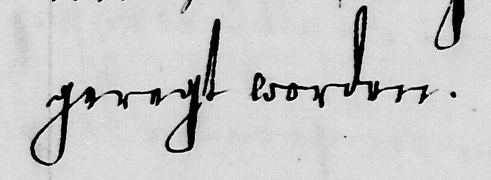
geregt worden.
